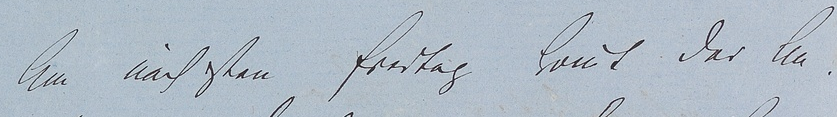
Am nächsten Freitag kommt der An-
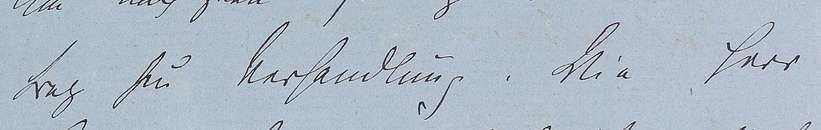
trag zu Verhandlung. Wie Herr
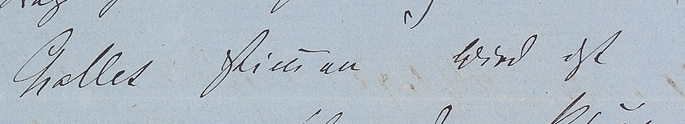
Challet stimmen wird ist
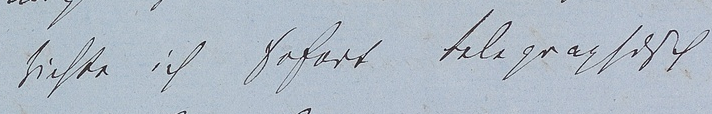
richte ich sofort telegraphisch.
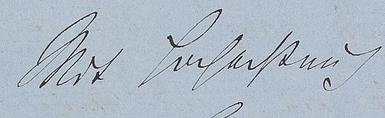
Mit Hochachtung
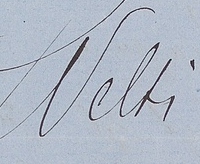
Bern
